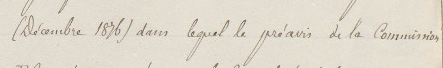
(Décembre 1876) dans lequel le préavis de la Commission
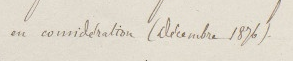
en considération (Décembre 1876).
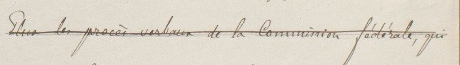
Plus les procès verbaux de la Commission fédérale, qui
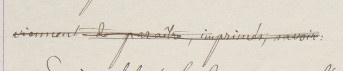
viennent de paraître, imprimés, savoir:
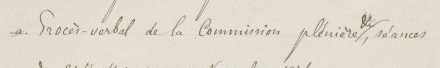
a. Procès-verbal de la Commission plénière &c, séances
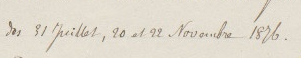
des 31 Juillet, 20 et 22 Novembre 1876.
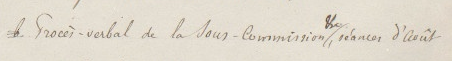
b. Procès-verbal de la sous-Commission &c, séances d'Août
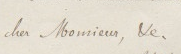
cher Monsieur, &c
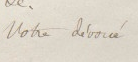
Clément Maraini,
